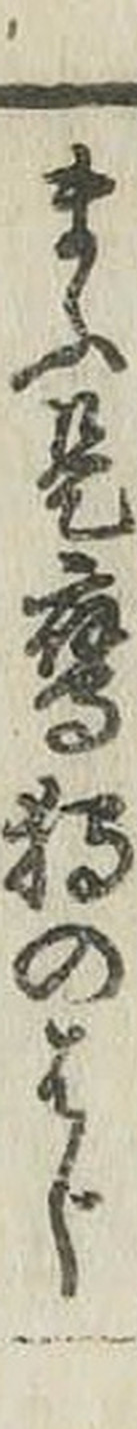まふ是鷹狩のはじ
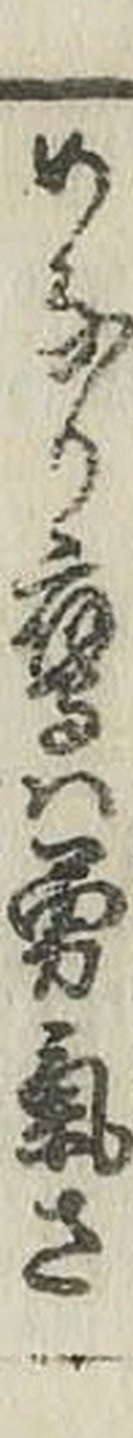めなり鷹は勇気さ
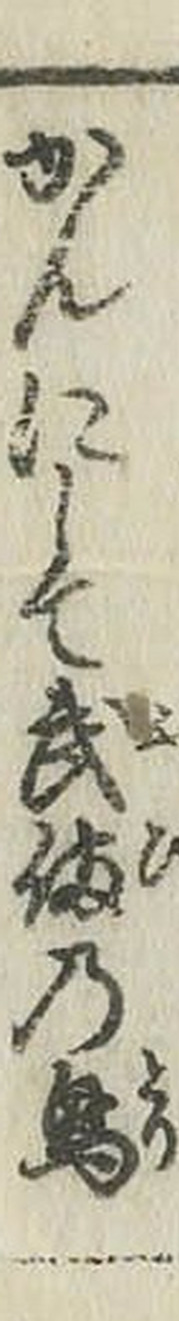かんにして武備の鳥
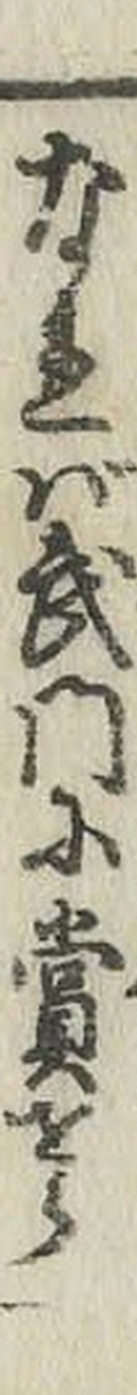なれば武門に賞せら

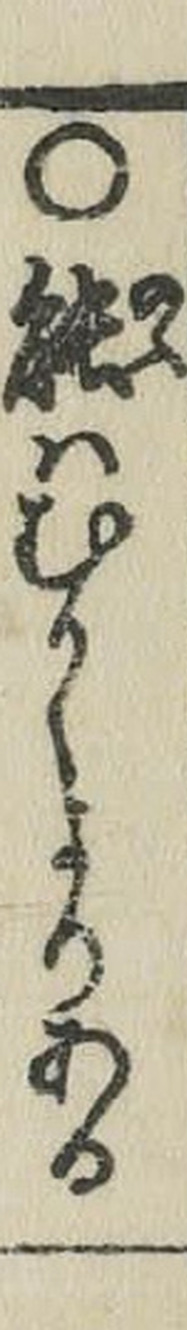○能はむかしよりある
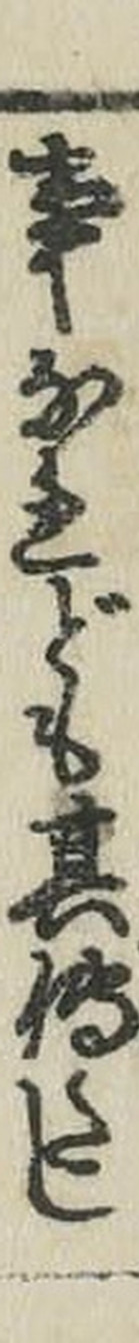事なれども其伝たし
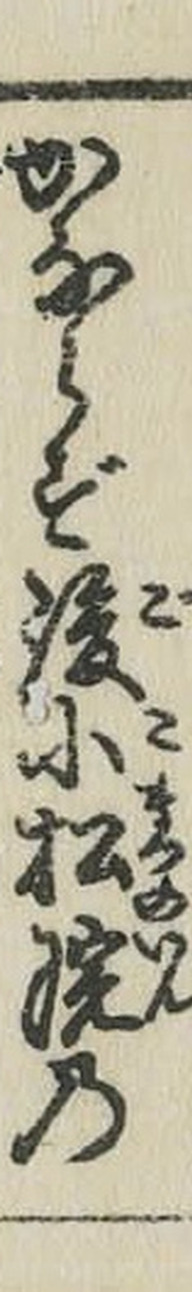かならず後小松院の
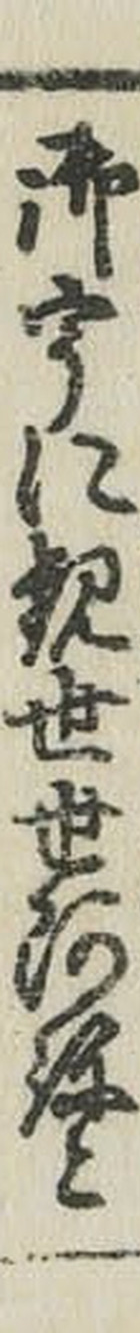御宇に観世世阿弥と
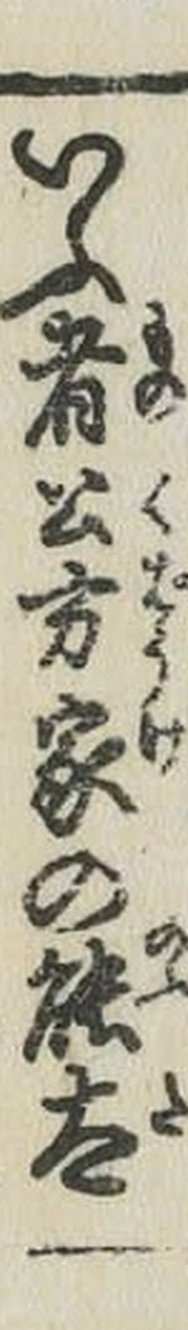いふ者公方家の能太
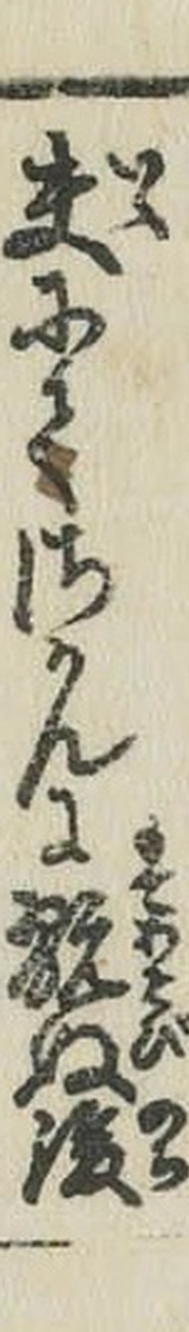夫にてさかんに翫ぬ後
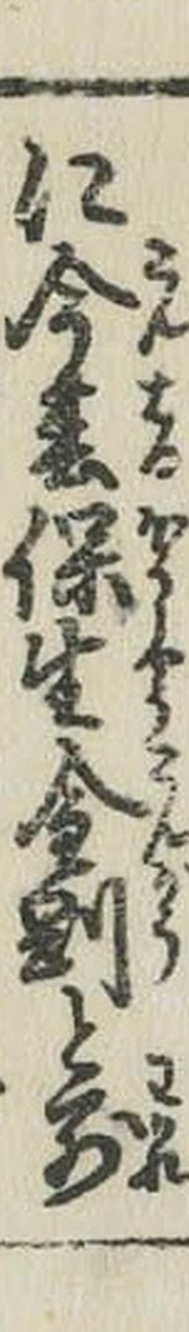に金春保生金剛と別
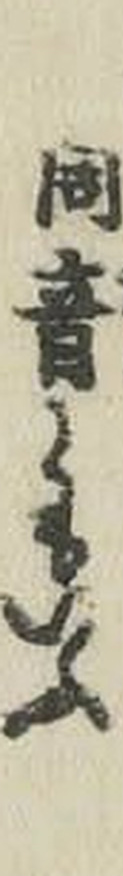同音ともいふ
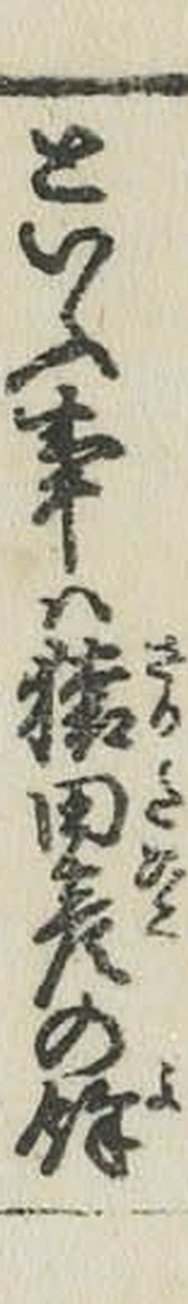といふ事は猿田彦の余
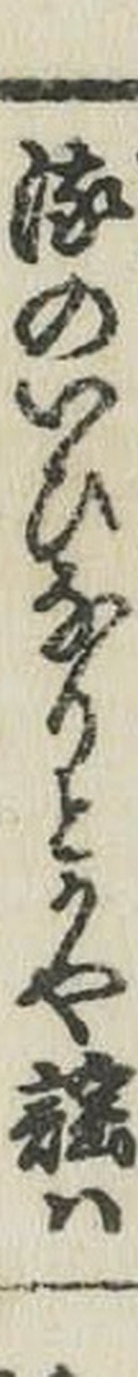流のいひなりとかや謡は
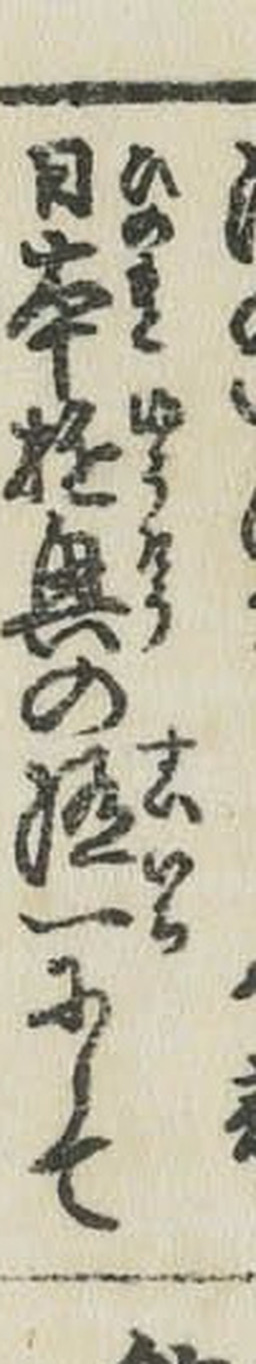日本遊興の随一にして
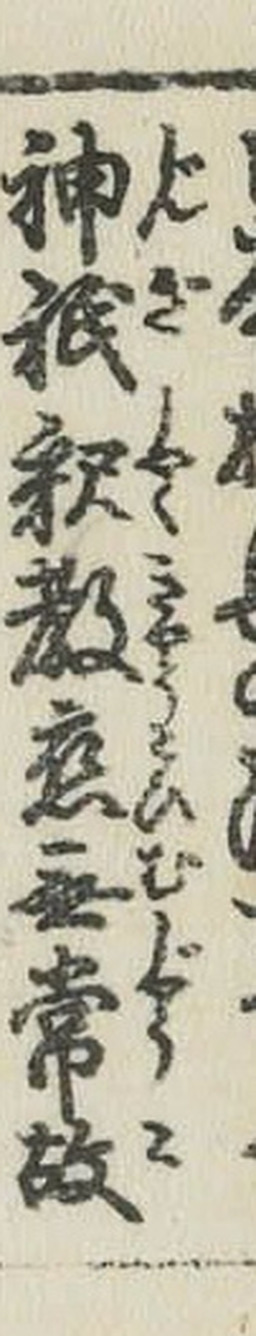神祇釈教恋無常故
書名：増補頭書訓蒙図彙大成 10巻 10:巻之21
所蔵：東京学芸大学教育コンテンツアーカイブ
